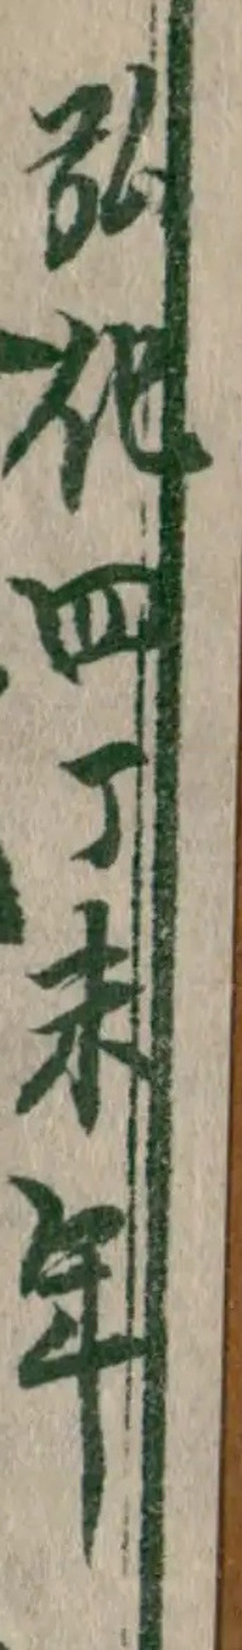弘化四丁未年
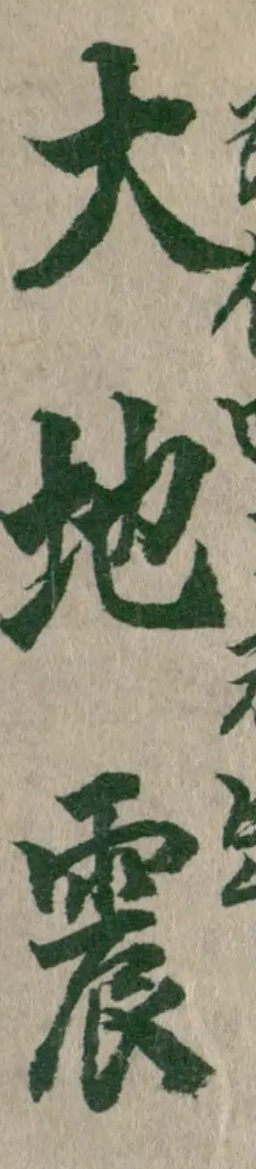大地震

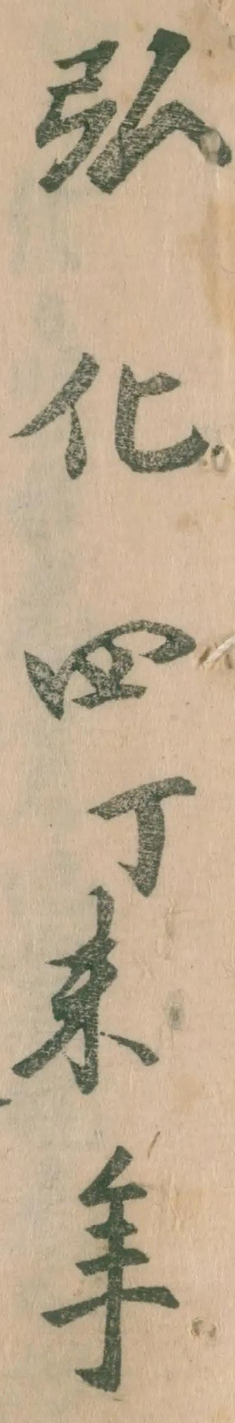弘化四丁未年
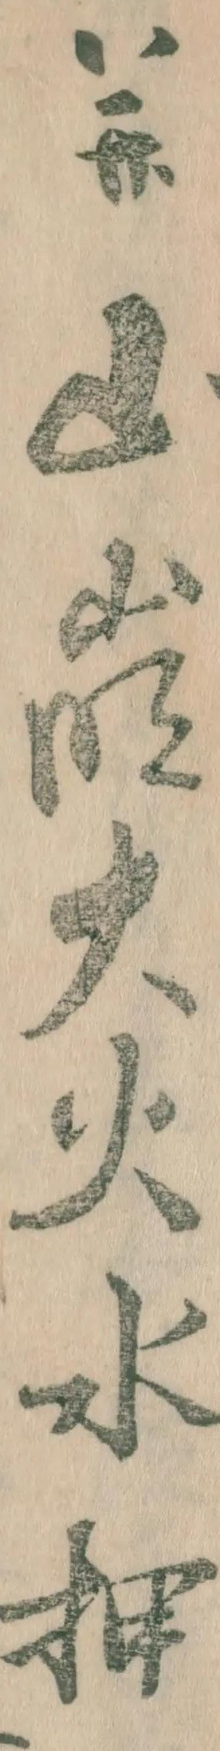并山崩大火水押
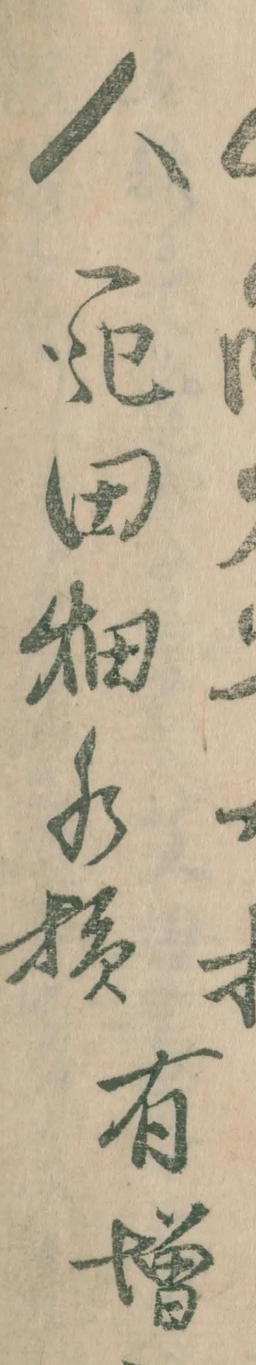人死田畑水損有増記

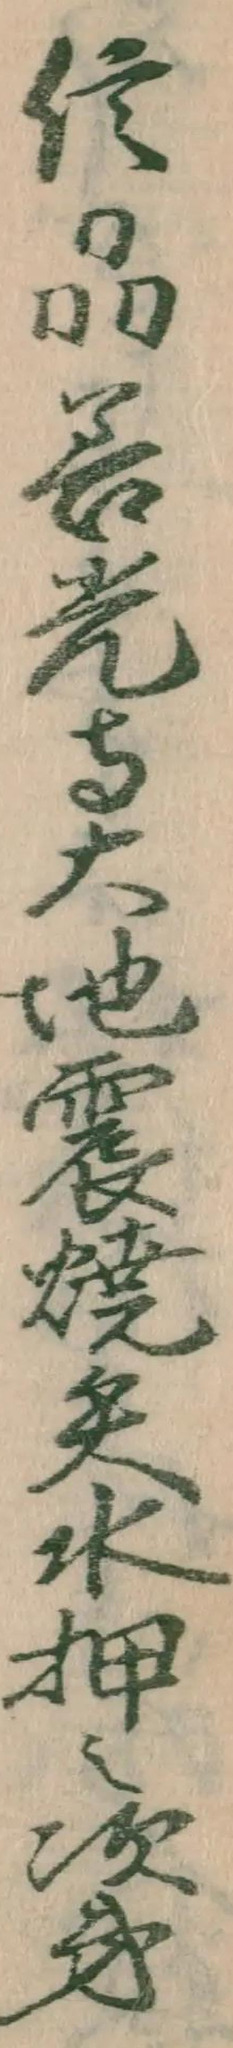信州善光寺大地震焼失水押之次第
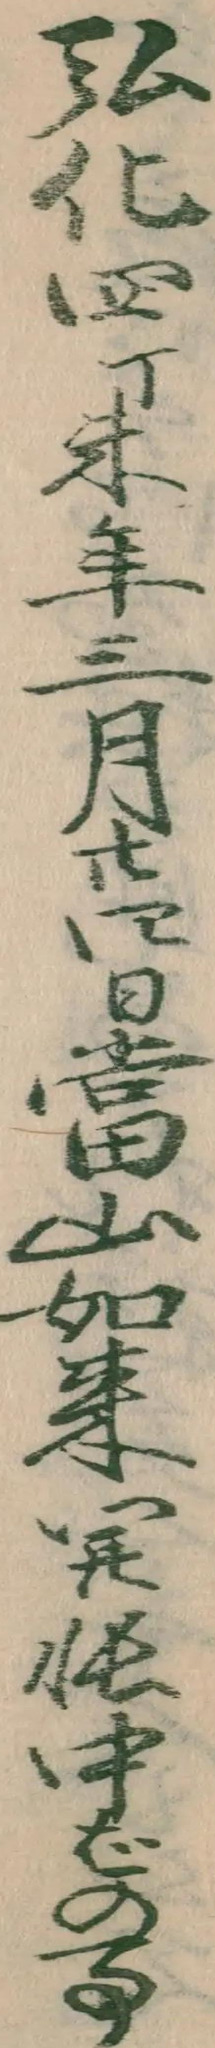弘化四丁未年三月廿四日当山如来開帳中ばの事
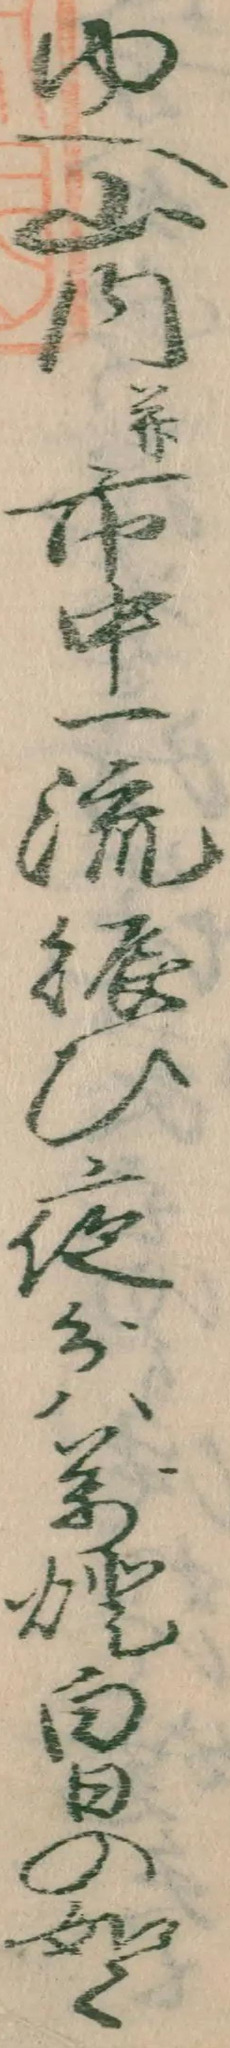ゆへ山内并市中一流振ひ夜分ハ万燈白日の如く
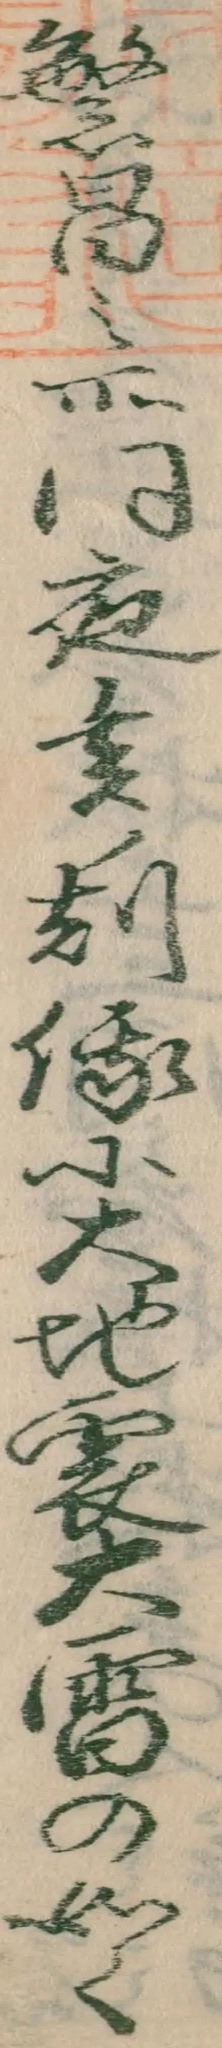繁昌之所同夜亥ノ刻俄に大地震大雷の如く
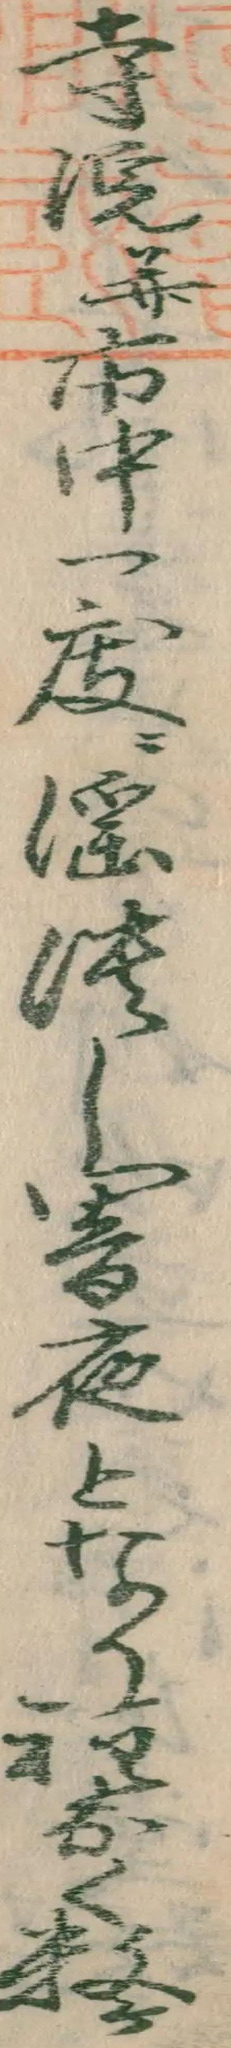寺院并市中一度ニ揺潰し闇夜となり程なく数ケ
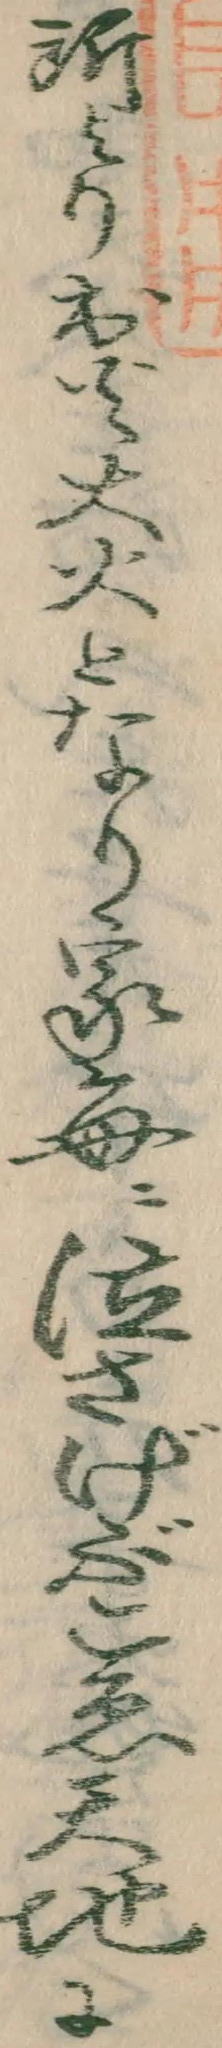所より出火大火となり家毎ニ泣さげぶこゑ天地に
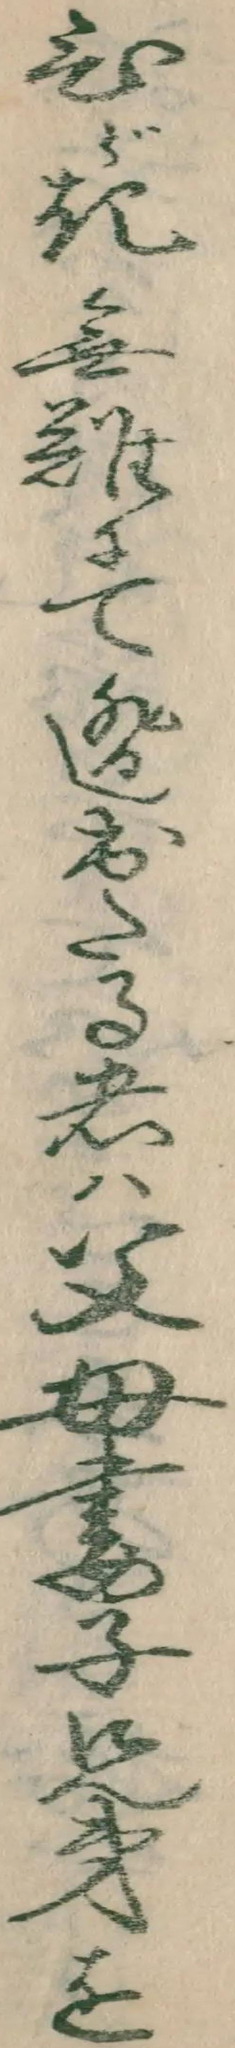ひゞき無難にて逃出たる者は父母妻子兄弟を
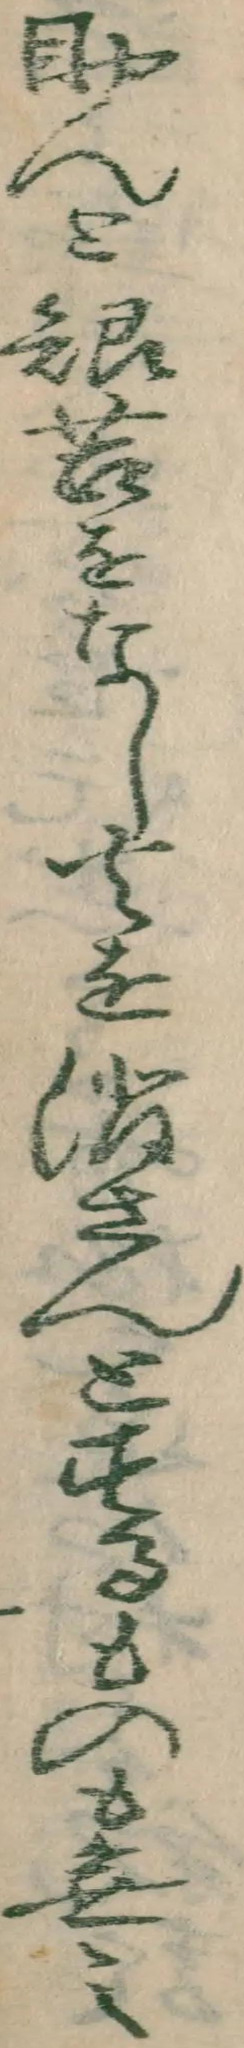助んと艱苦をなし火を消さんとするものも無之

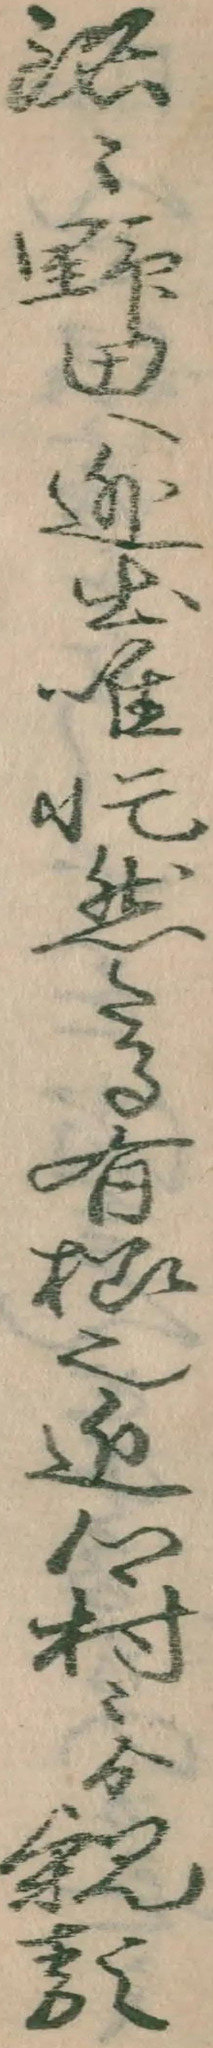銘〻野田へ逃出唯忙然たる有様也近郷村〻ゟ親類
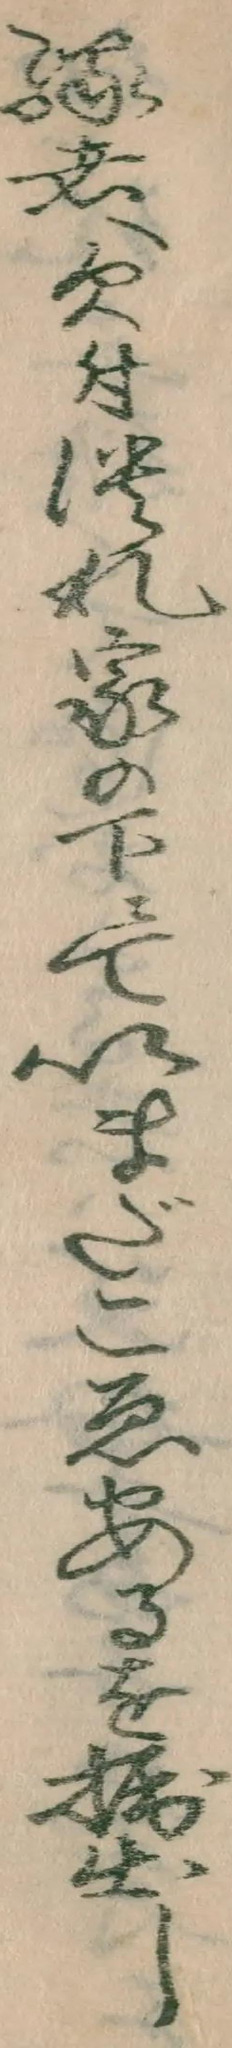縁者へ欠付潰れ家の下ニていまだこゑのあるを掘出し
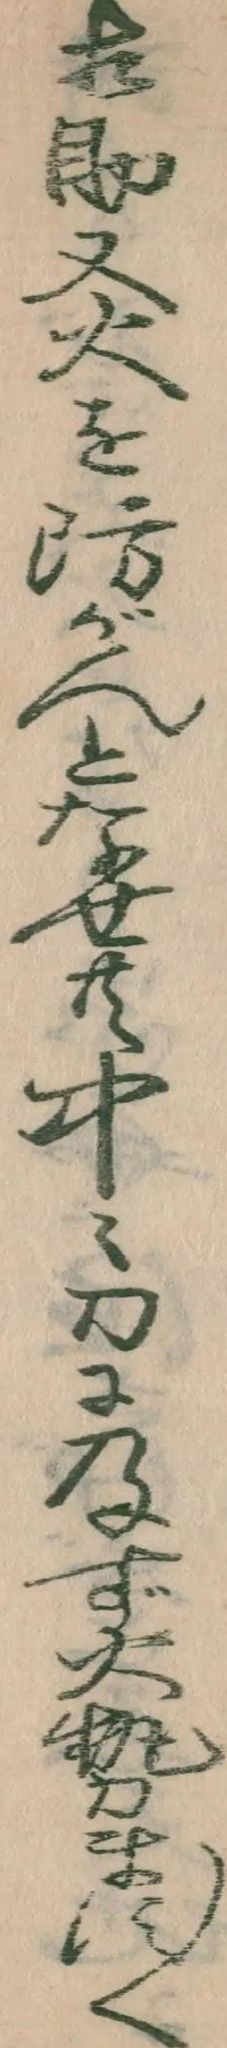相助又火を防がんとなせ共中〻力に及ず火勢ます〳〵
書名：大地震
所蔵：国立国会図書館 National Diet Library, JAPAN
